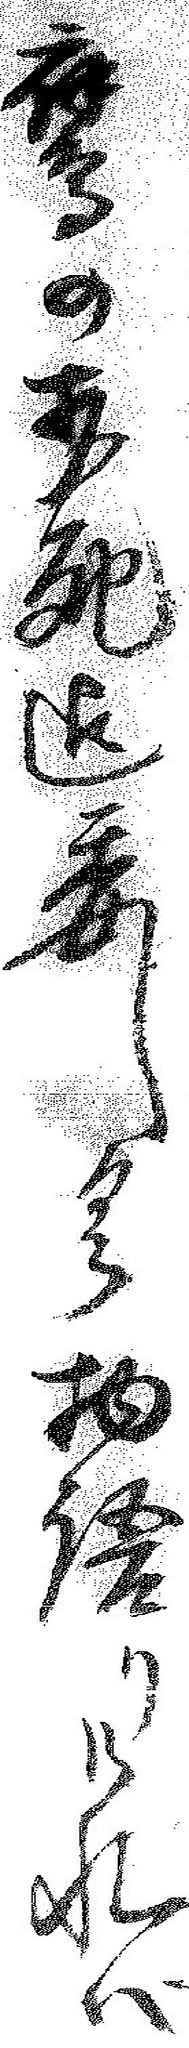鷹の打死迄委しく物語りければ
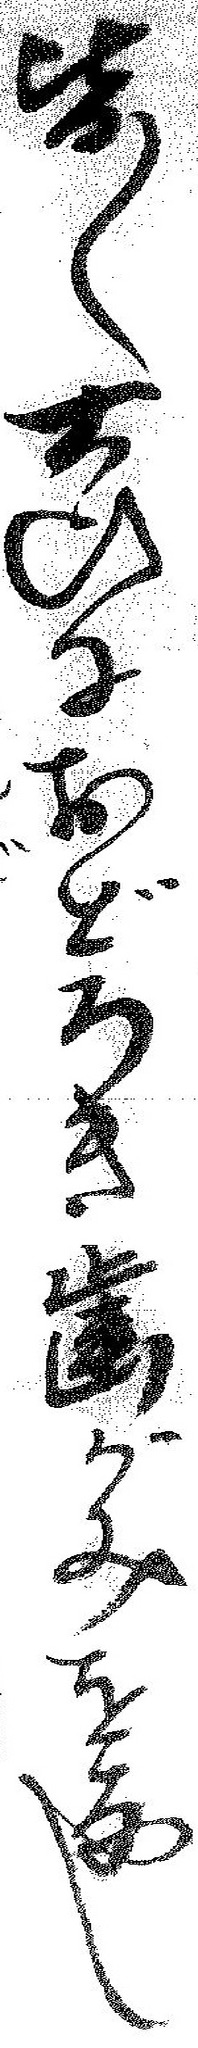皆〳〵大ひにおどろき歯がみをなし
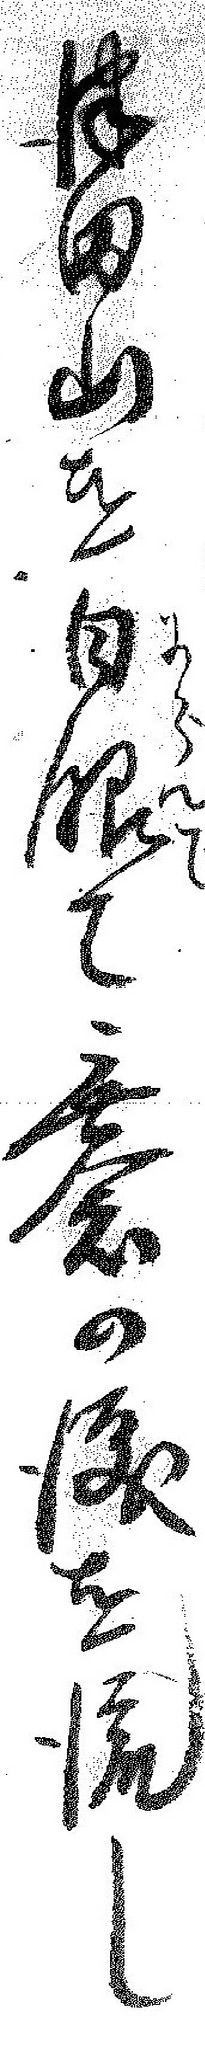津田山を白眼て無念の涙を流し
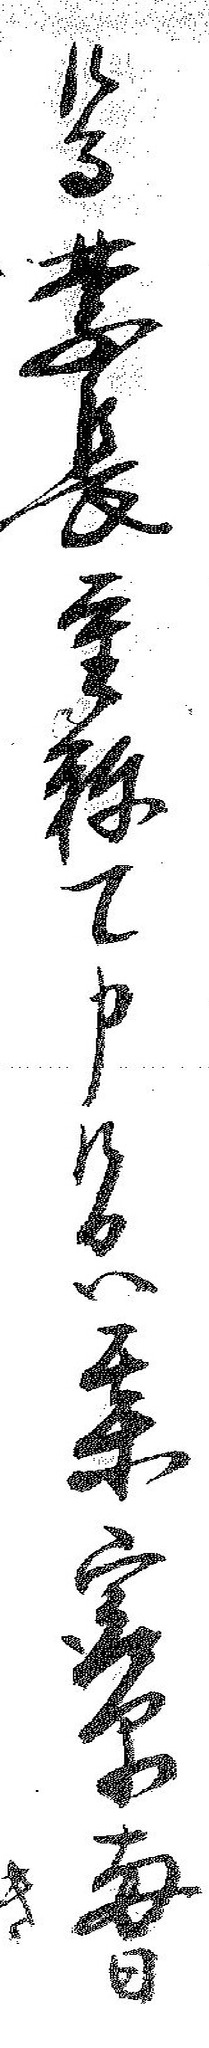ける禁長重ねて申けるは某最早両日
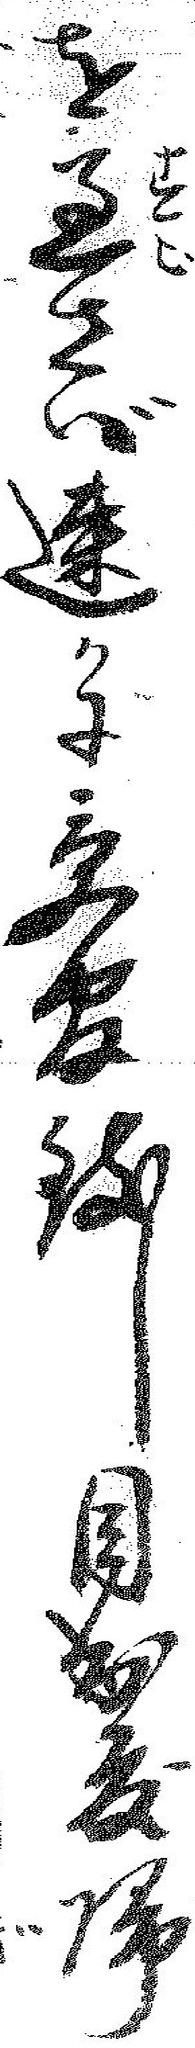を過さば速かに受官致し目出度帰
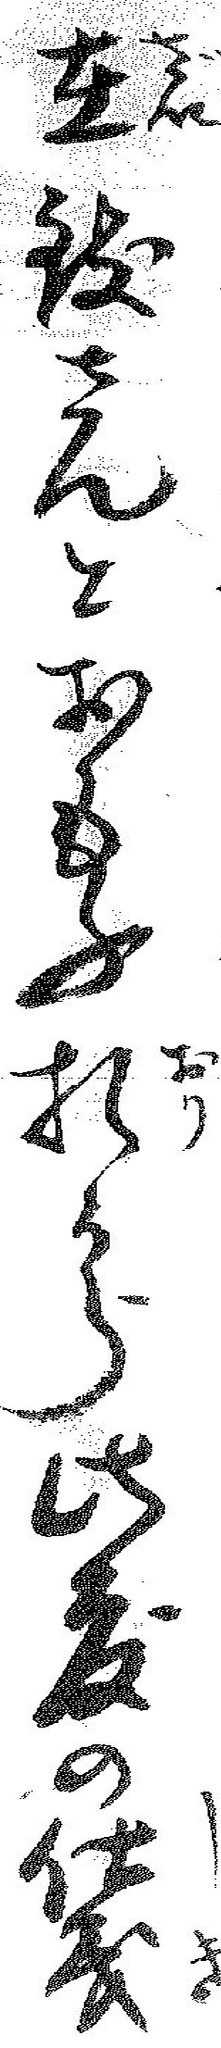在致さんとおもふ折から此度の仕義
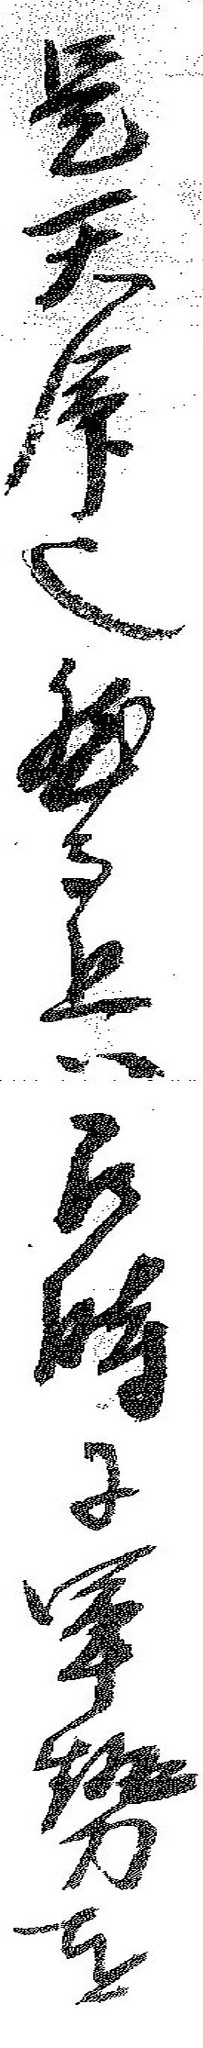是天命也然る上は即時に軍勢を
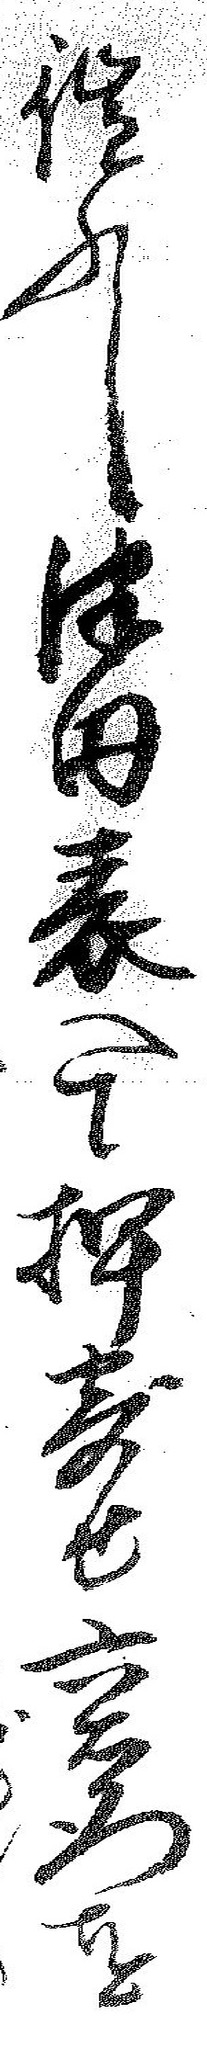催ふし津田表へと押寄せ六右衛門を
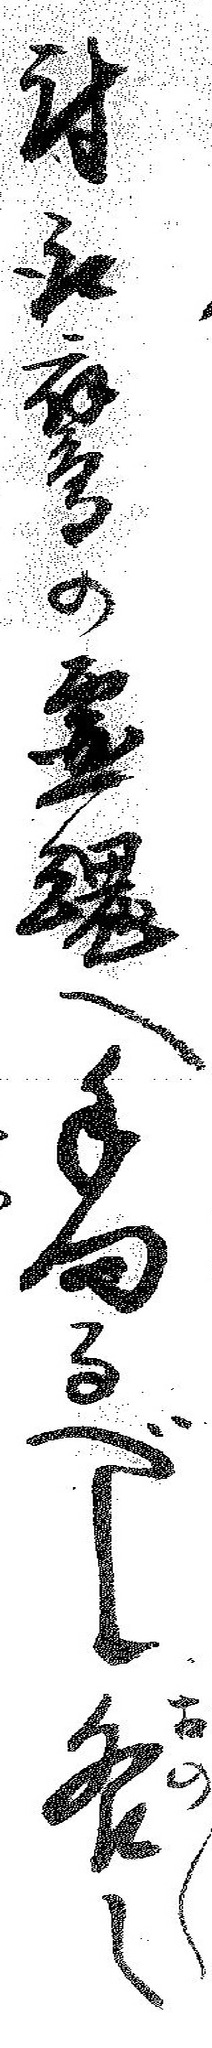討取鷹の霊魂へ手向るべし各々
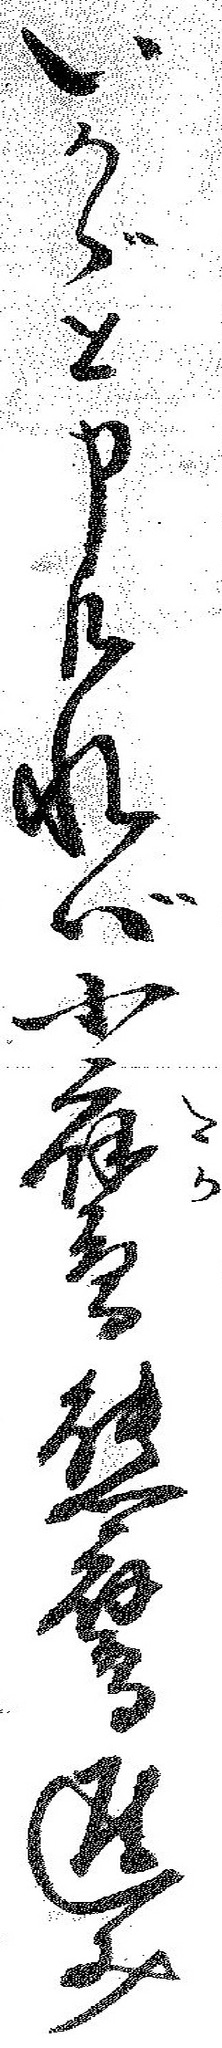いかゞと申ければ小鷹熊鷹進み
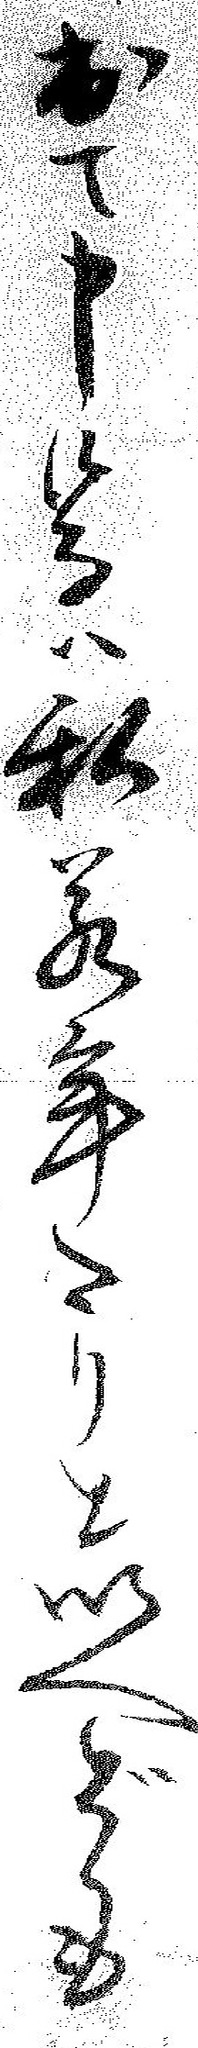出て申けるは私若年たりといへども
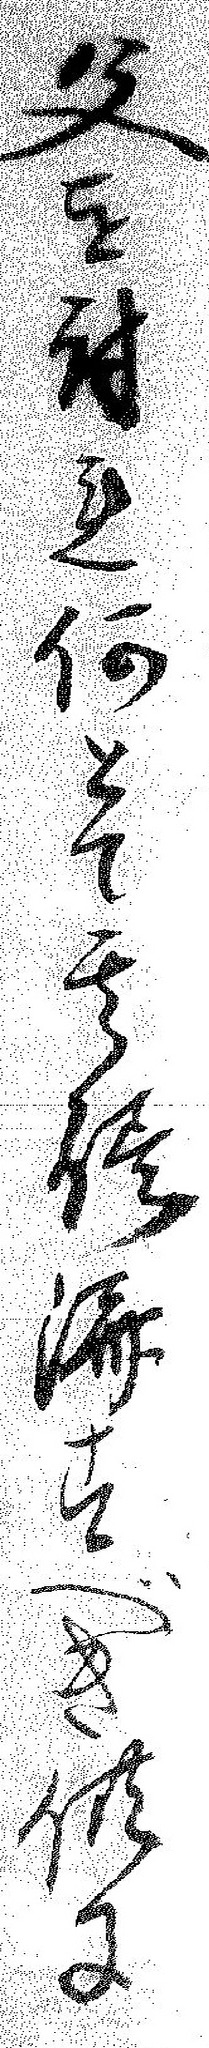父を討れ何とて其侭済すべき供に

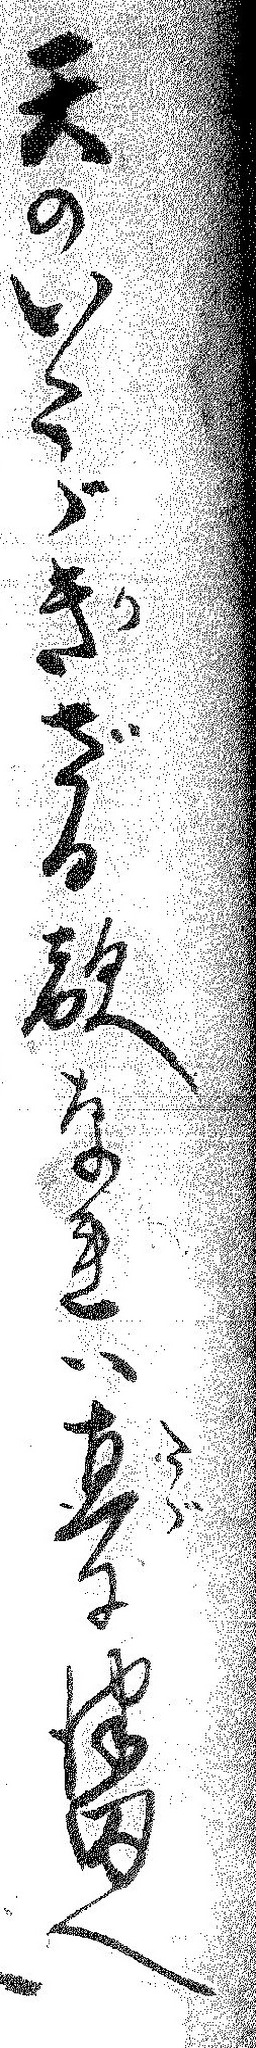天のいたゞきざる敵なれは直に津田へ
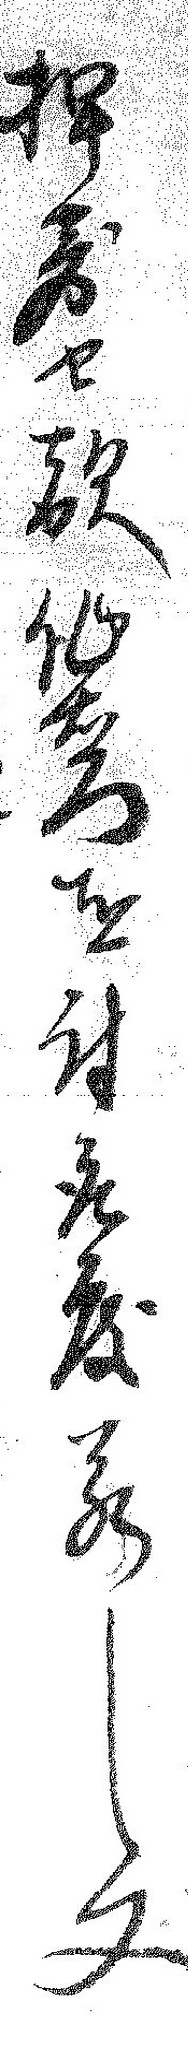押寄せ敵作右衛門を討取度若し又
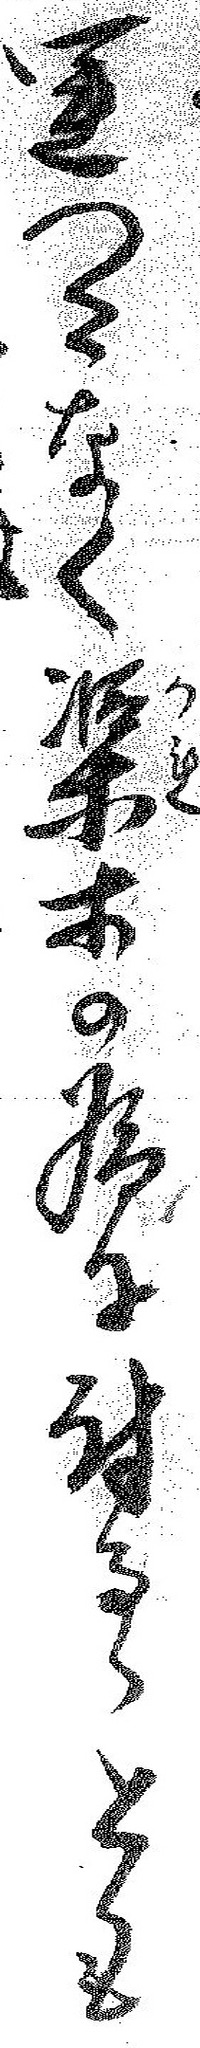運つたなく渠等の為に討るゝとも
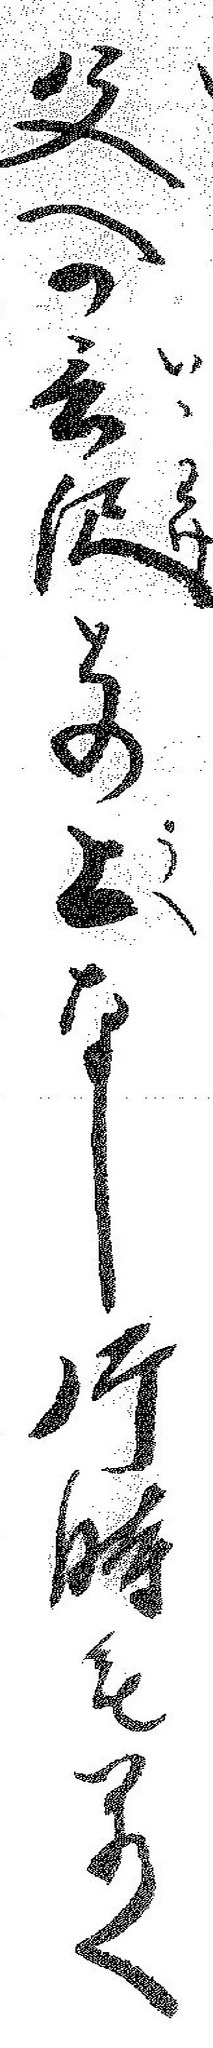父への言訳との上なし片時も早く
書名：近頃古狸珍説　礼義智信
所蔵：徳島県立図書館
